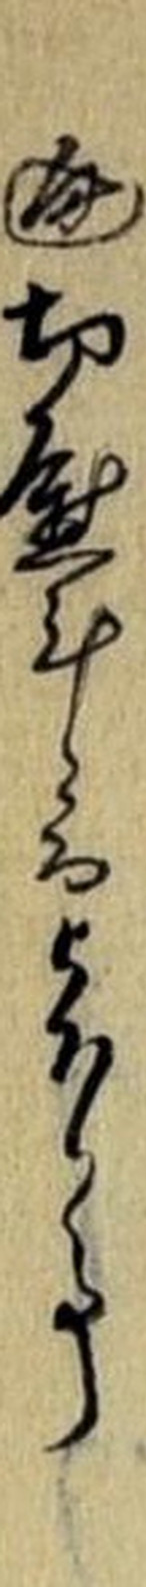通切熨斗ニ而被下候事
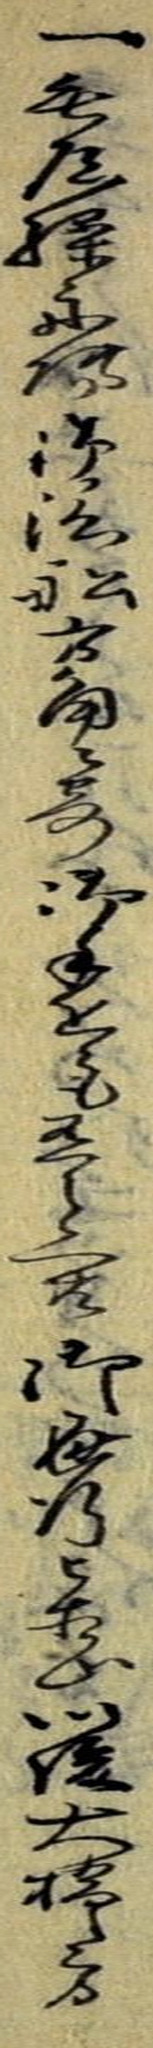一毛屋繰舟舟場御渡船方角ニ寄御手近ニも有之候へ共御通行被相止以後大橋之方
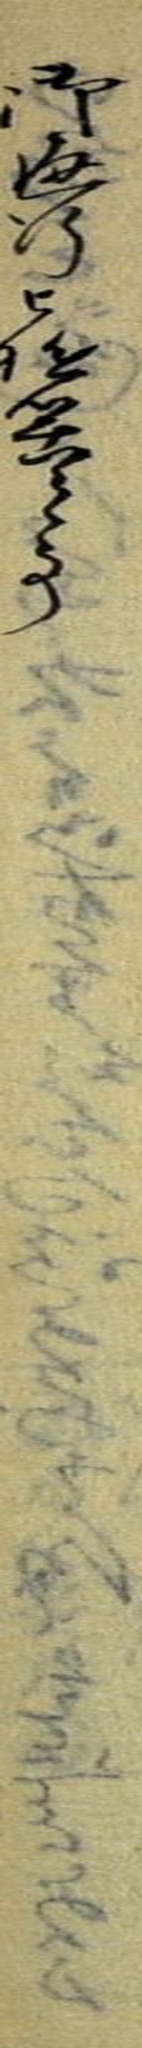御通行被遊筈ニ候事
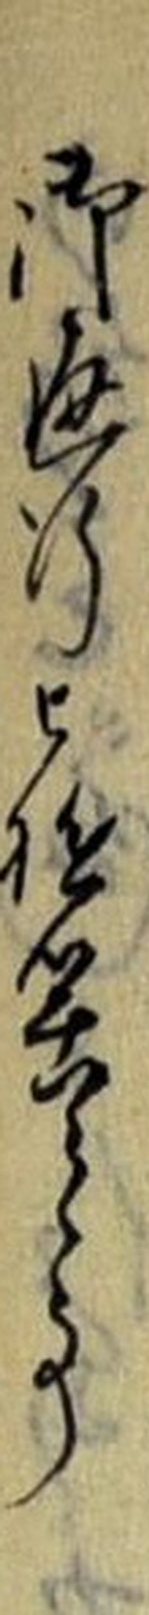御通行被遊筈ニ候事
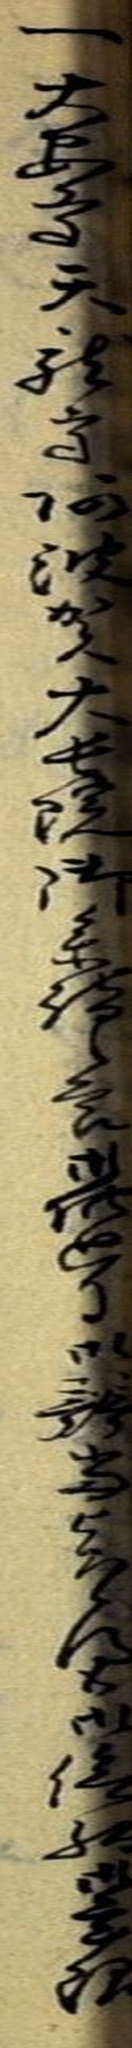一大安寺天龍寺阿波賀大長院御参詣之節御供廻り御弁当被下候得共御倹約御年限
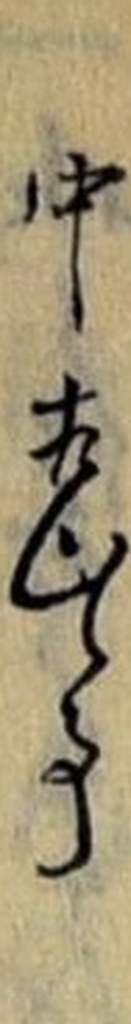中相止候事
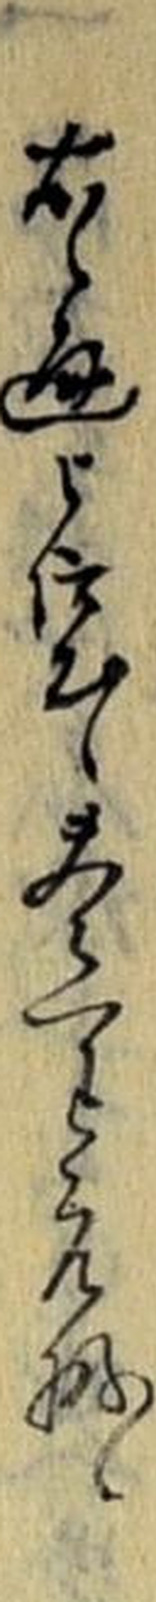右之通被仰出候夫々可取扱候
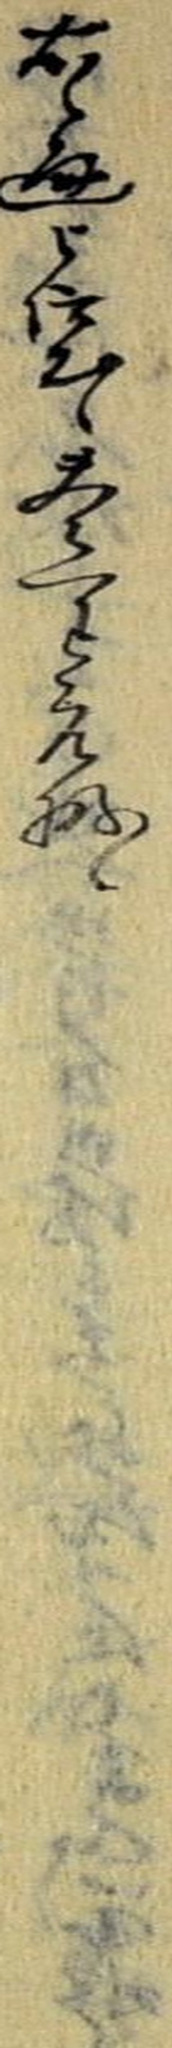右之通被仰出候夫々可取扱候
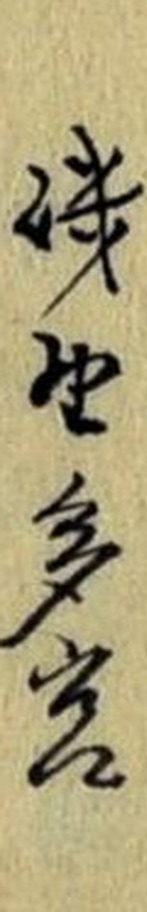磯野多宮
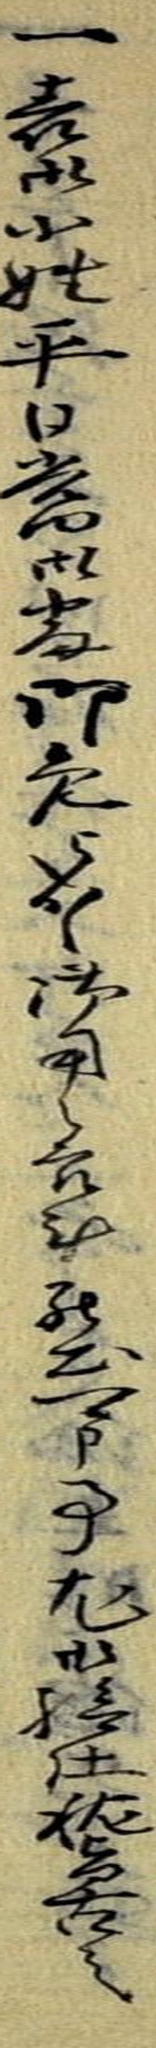一表御小姓平日当御番御免被成候御用之節斗罷出可申事尤御給仕稽古之
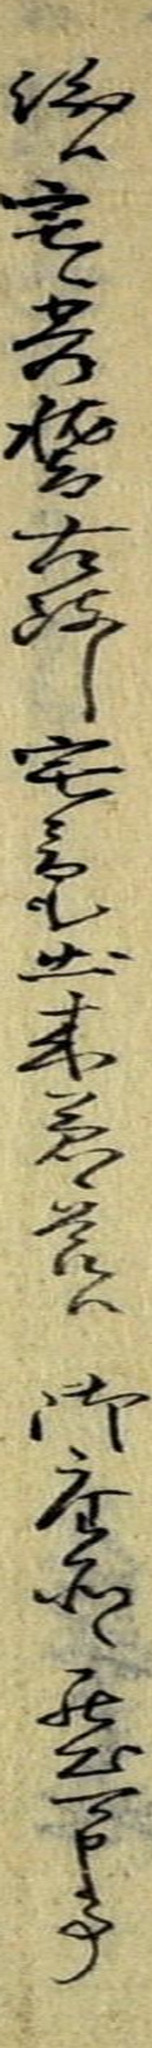儀ハ宅へ寄稽古致し宅ニ而も出来兼候節ハ御座所へ罷出可申事
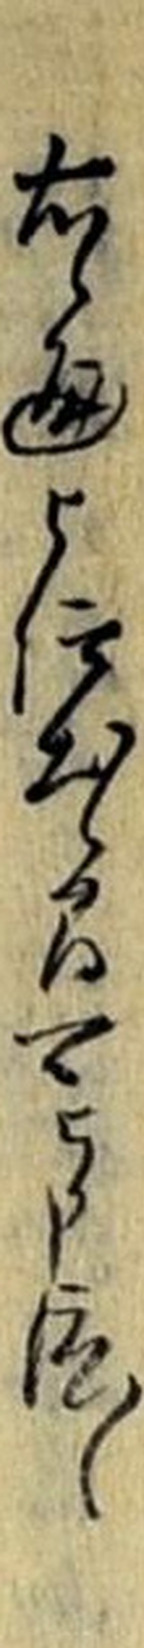右之通被仰出候間可被申渡候
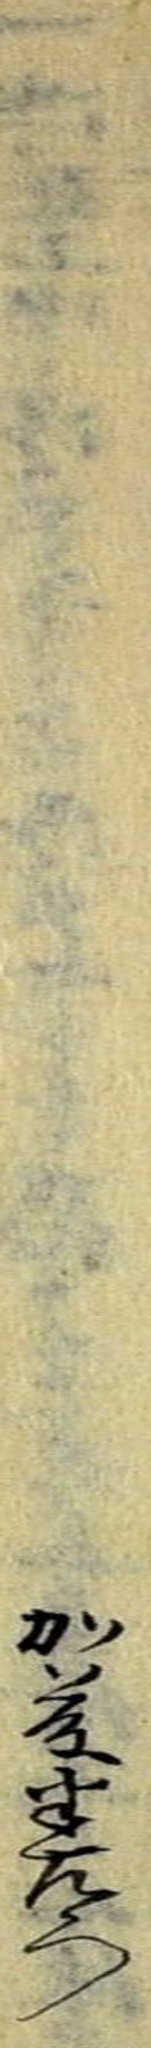加藤半左衛門
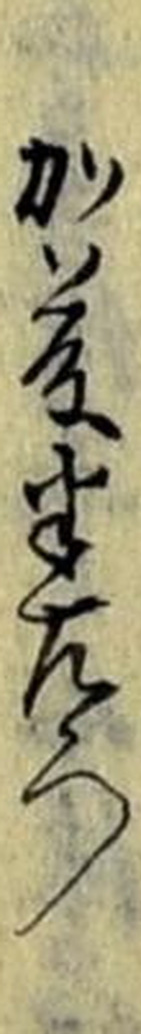加藤半左衛門
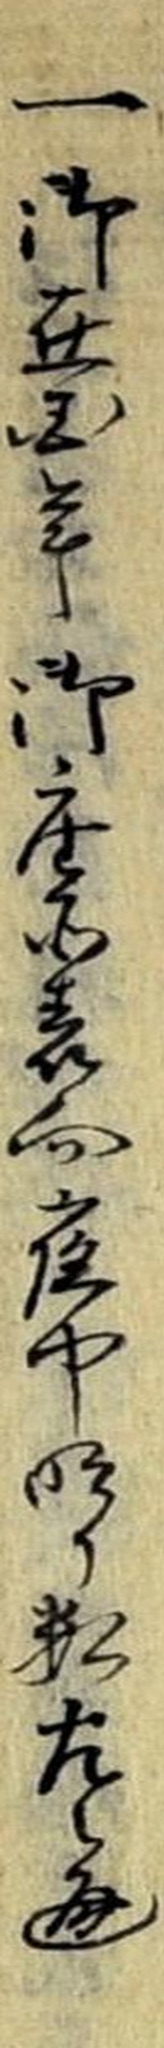一御在国年御座所表向夜中明り数左之通
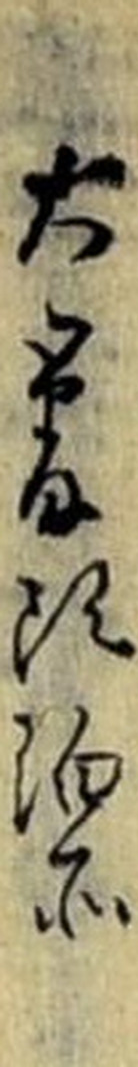大御番頭泊所一
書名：命令之部 三
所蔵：福井県文書館 Fukui Prefectural Archives
